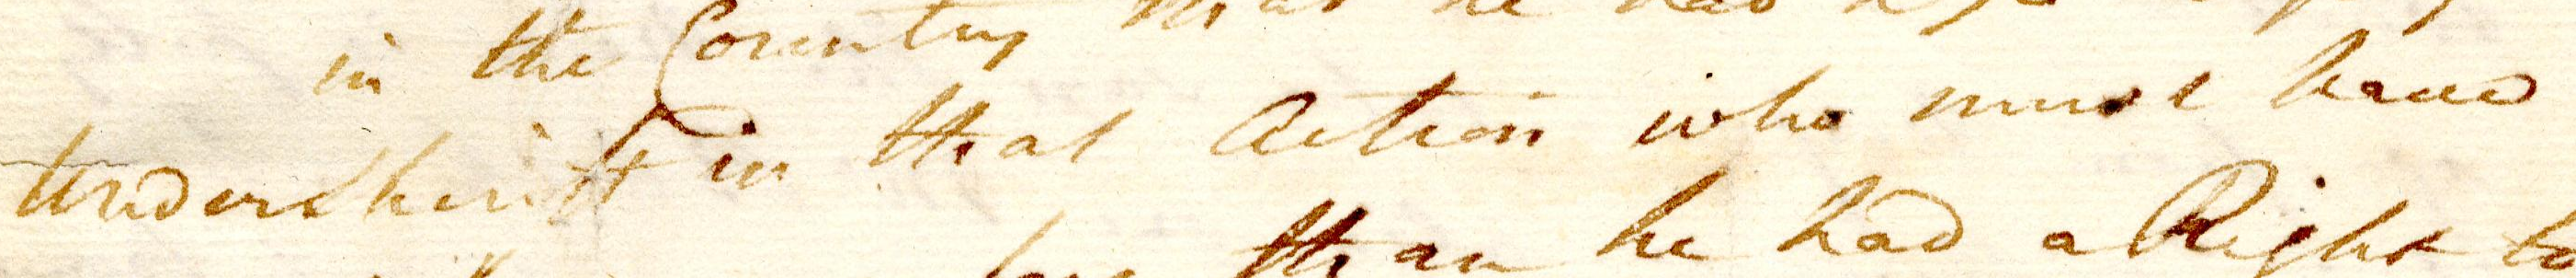tender herit in that Action who must have
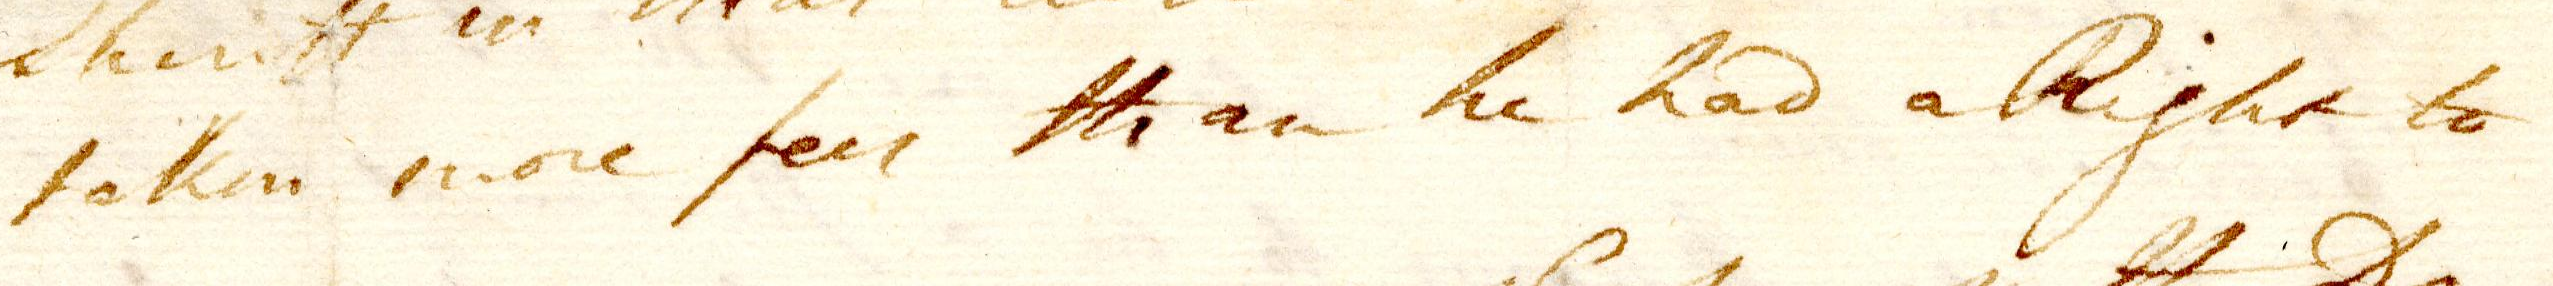taken more fecs than he had a Right to
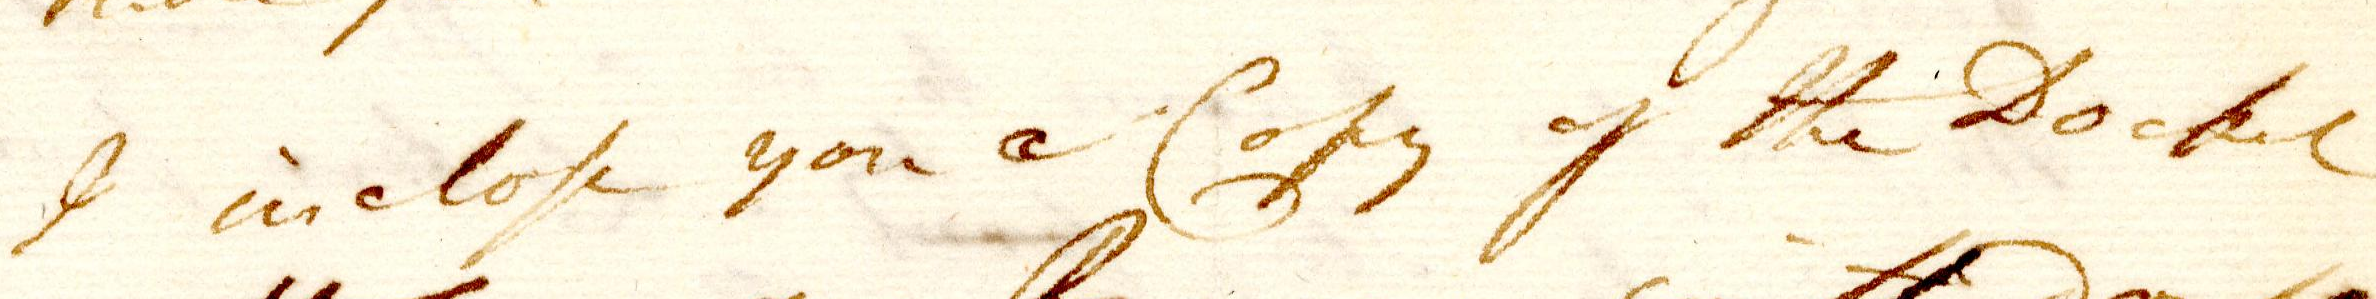I inclose you a Copy of the Docket
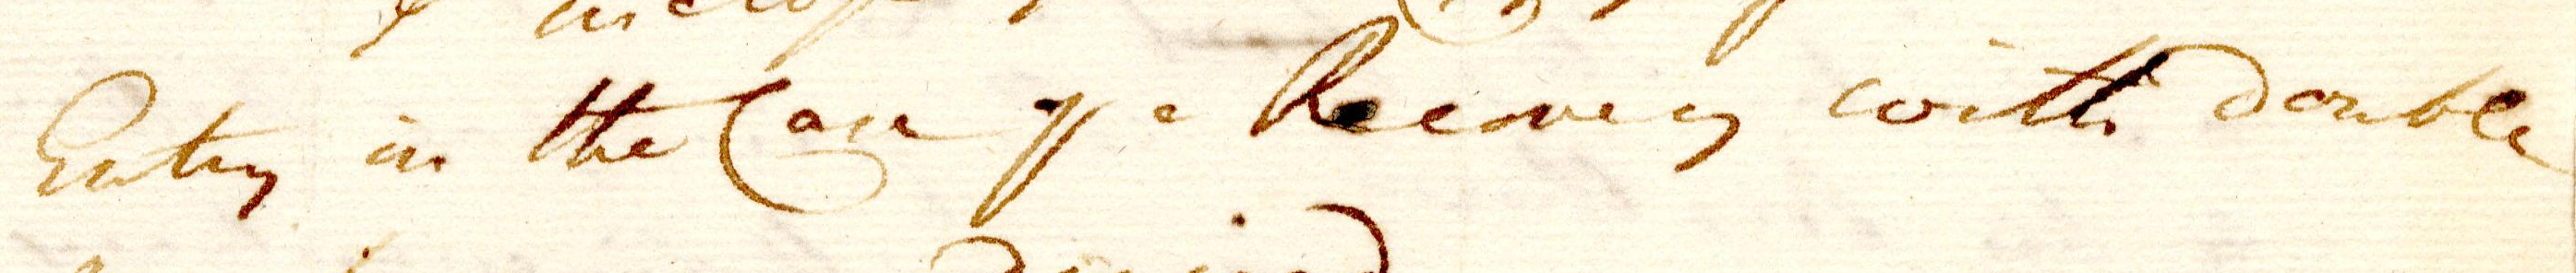Entry in the Case y^r Reeves with doube
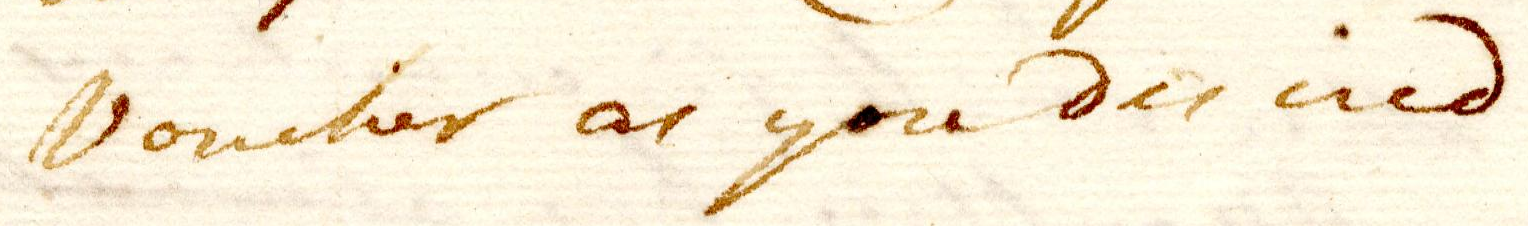Voucher as you descried
